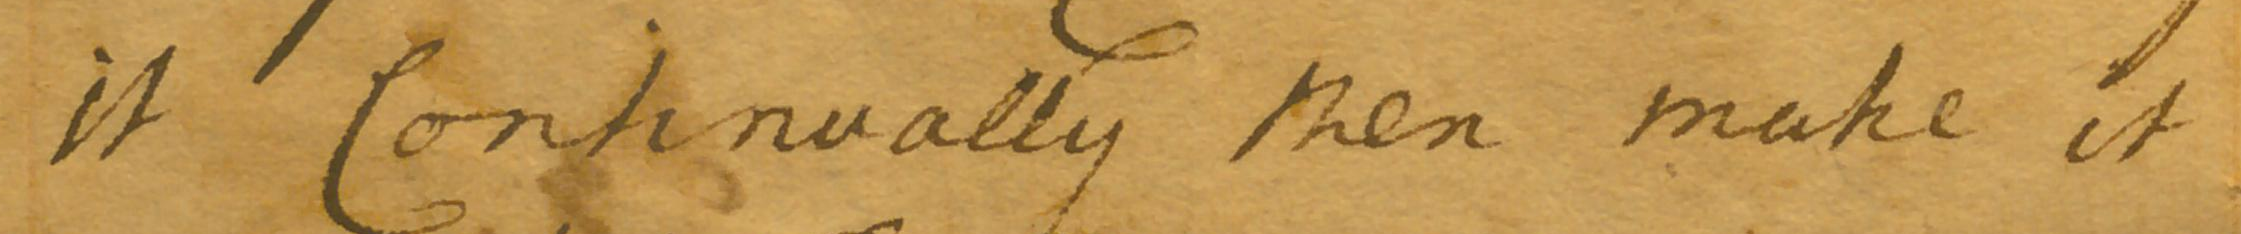it Continually then make it
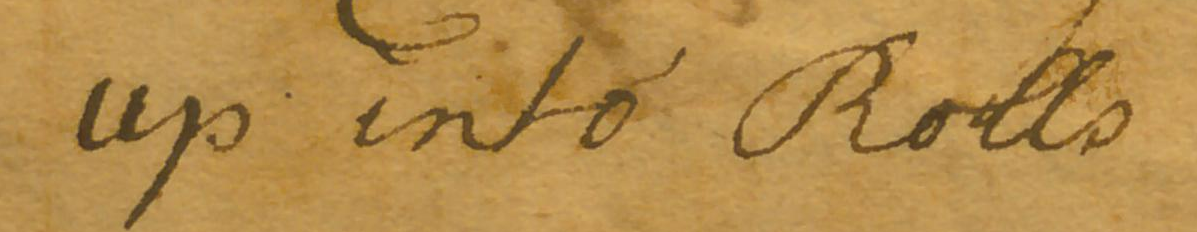up into Rolls
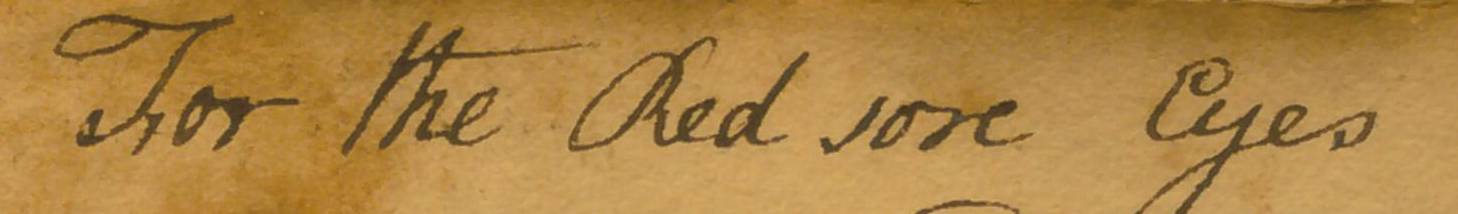For the Red sore Eyes
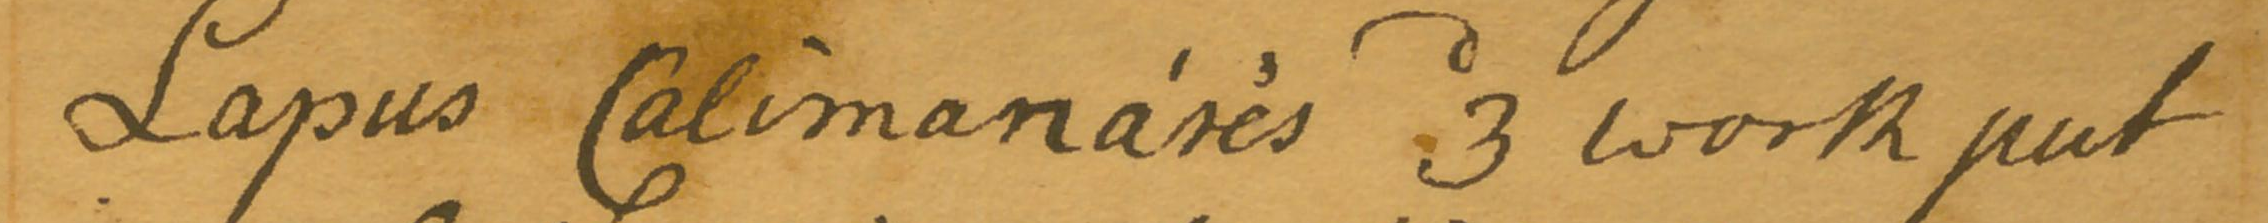Lapus Calimanres 3^d worth put
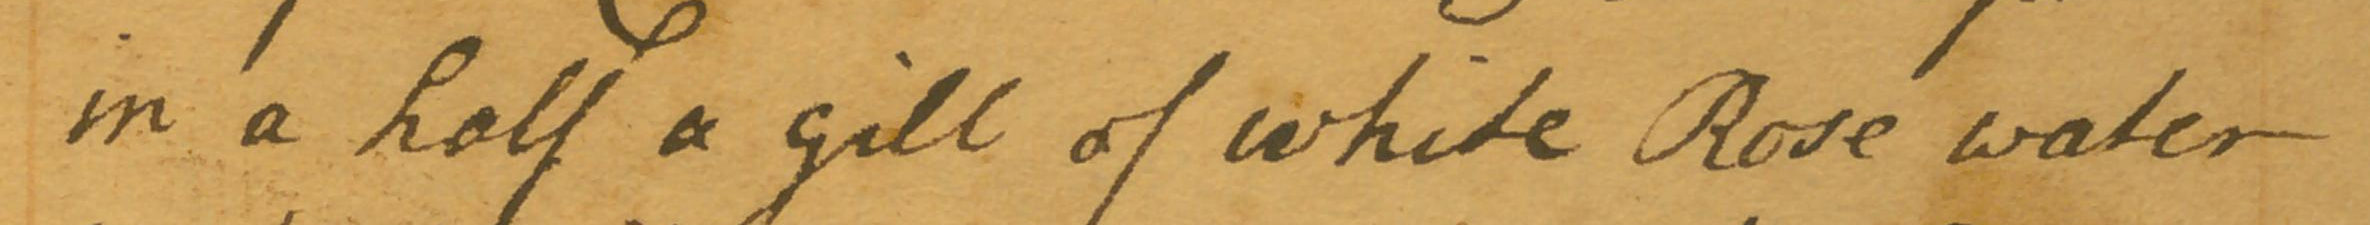in a half a gill of white Rose water
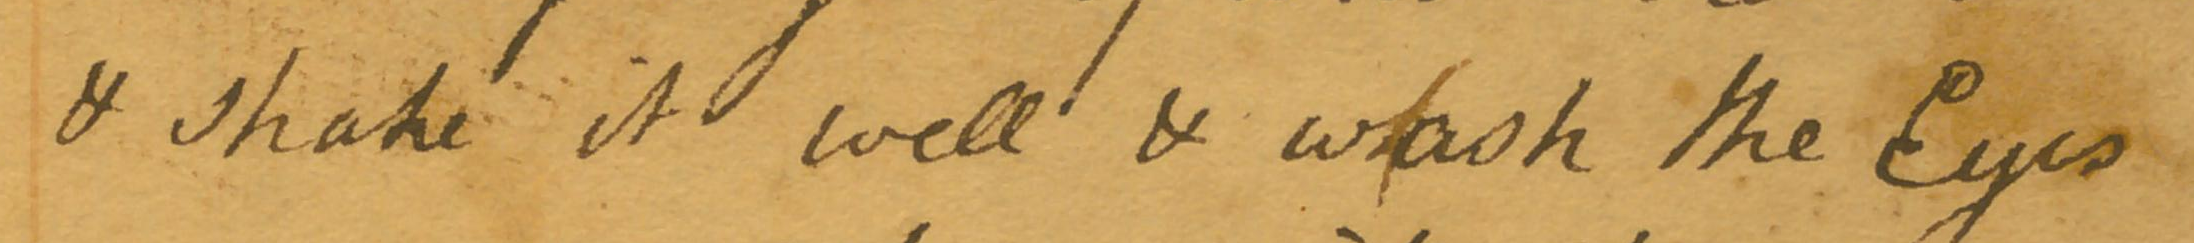& shake it well & wash the Eyes
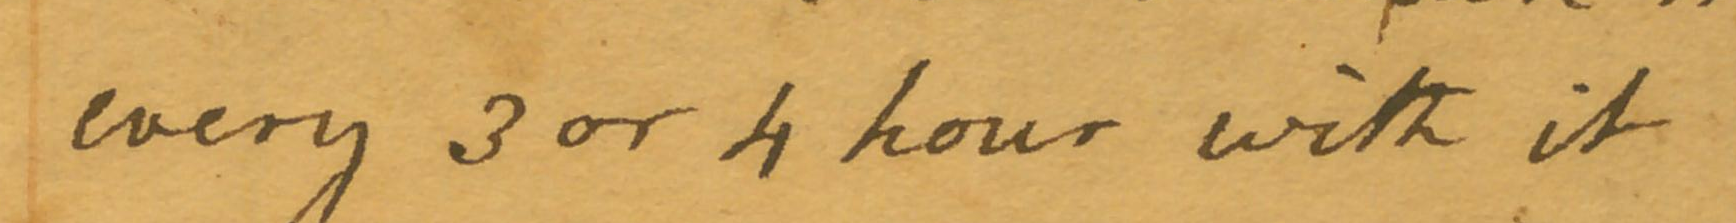every 3 or 4 hour with it
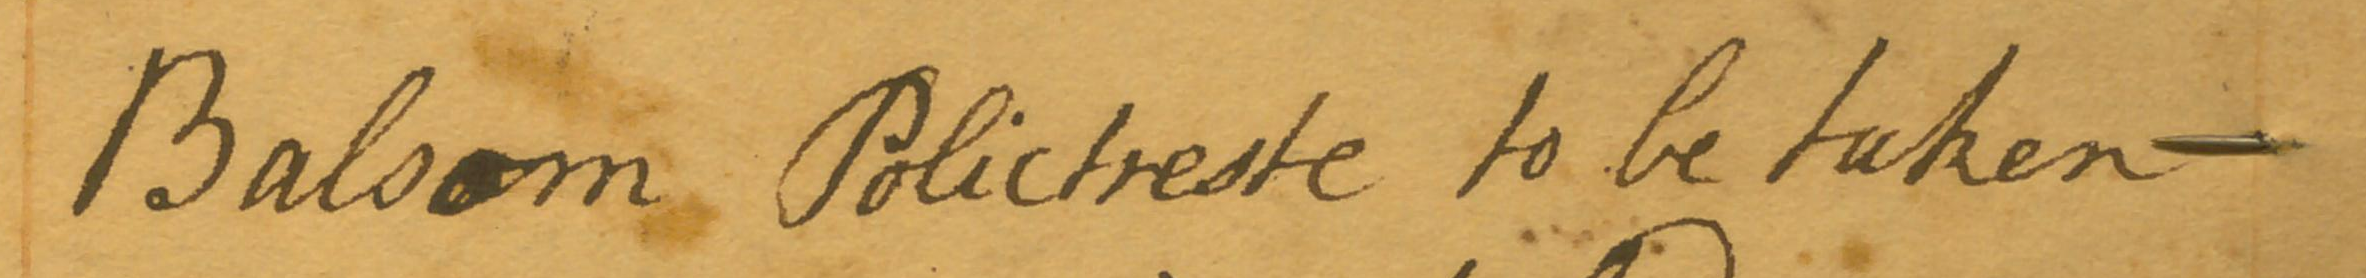Balsam Polictreste to be taken-
